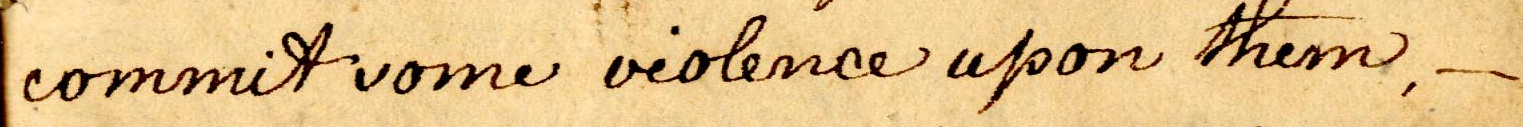commit some violence upon them,-
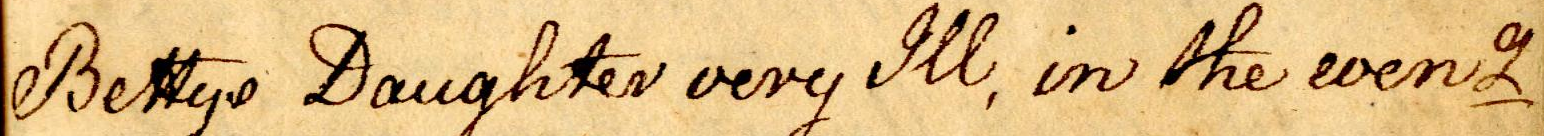Bettys Daughter very Ill, in the even^g
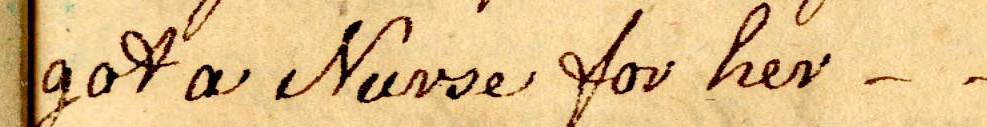got a Nurse for her -
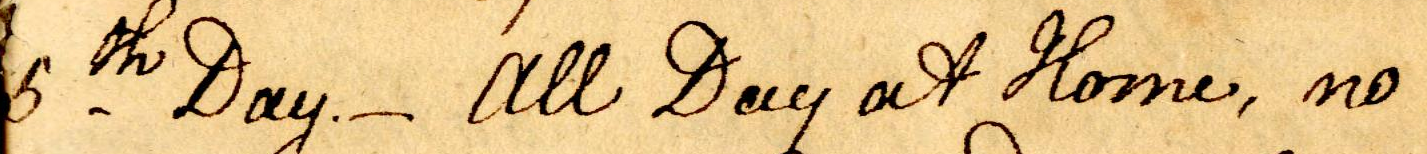5^th. Day. - Al Day at Home, no
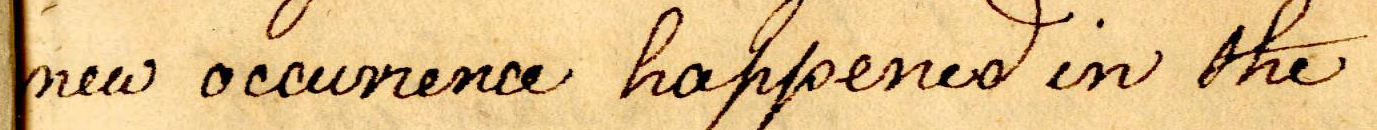new occurence happened in the
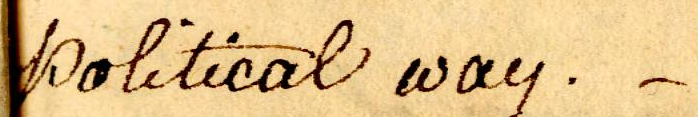political way.-
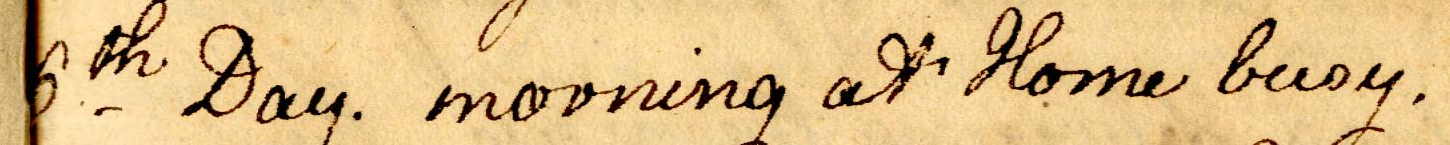6^th Day. morning at Home busy,
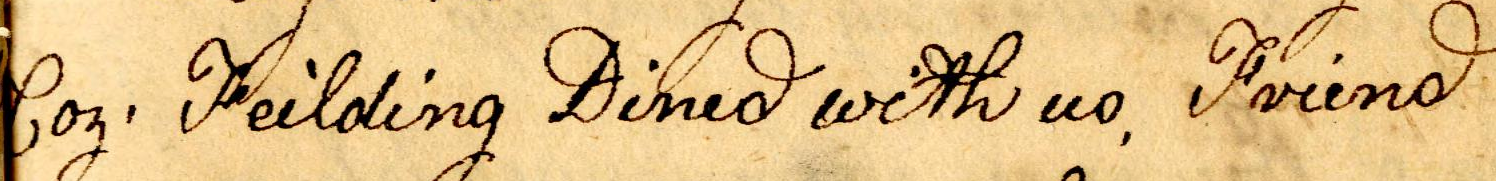Coz. Feilding Dined with us, Friend
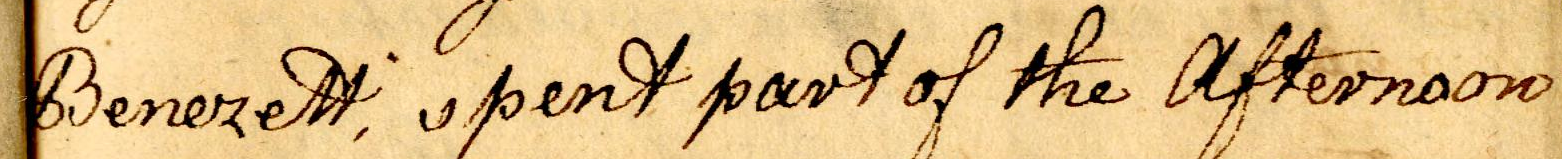Benzett, spent part of the Afternoon
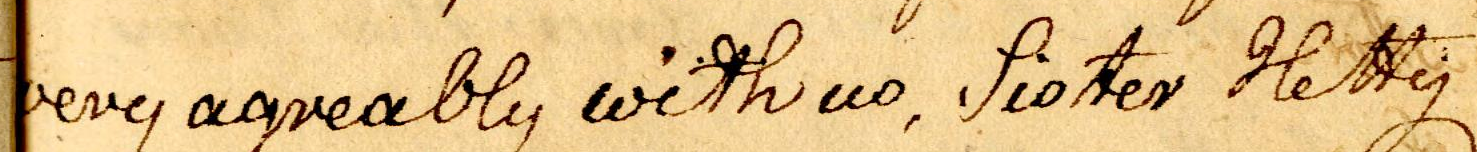very agreably with us, Sister Hetty
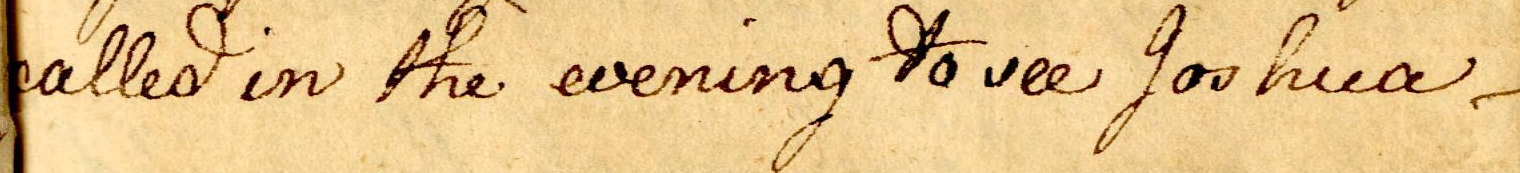called in the evening to see Joshua -
